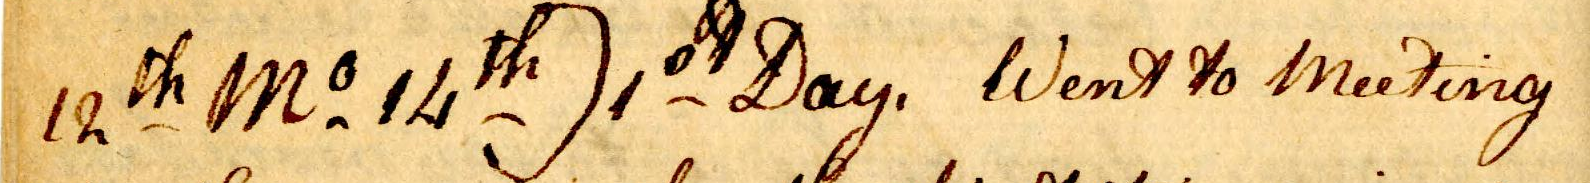12^th M^o 14^th) 1^st Day, Went to Meeting
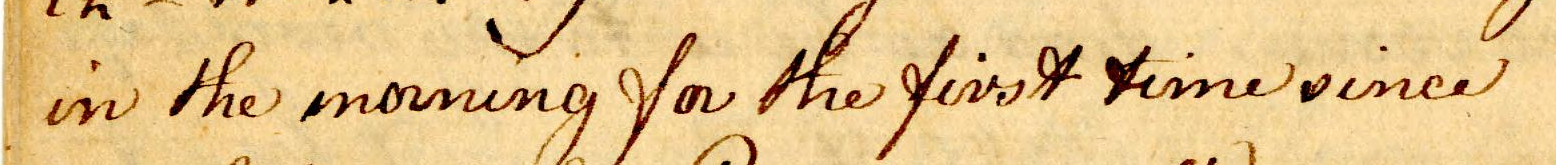in the morning for the first time since
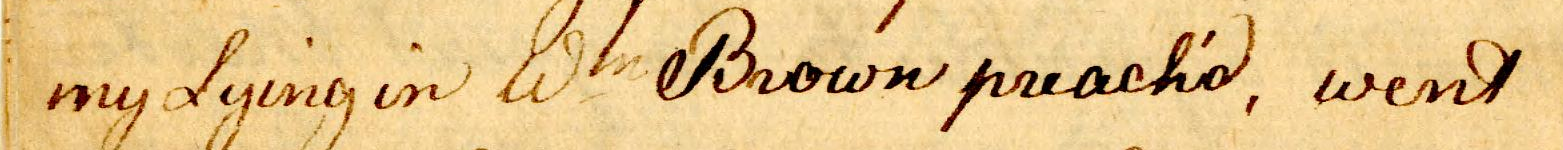my Lying in W^m Brown preach'd, went
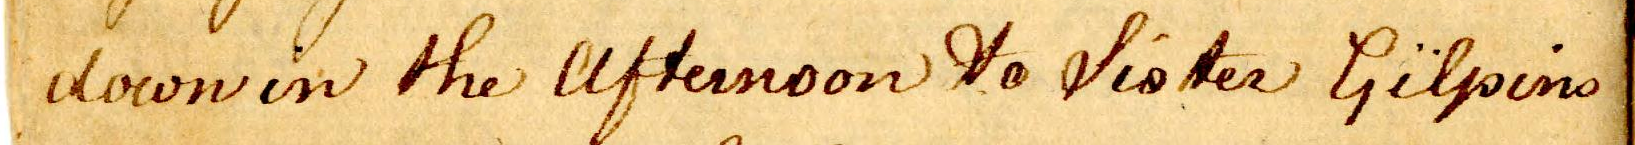down in the Afternoon to Sister Gilpins
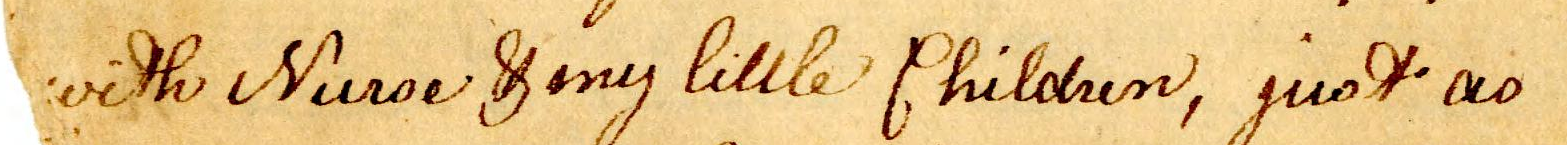with Nurse & my little Children, just as
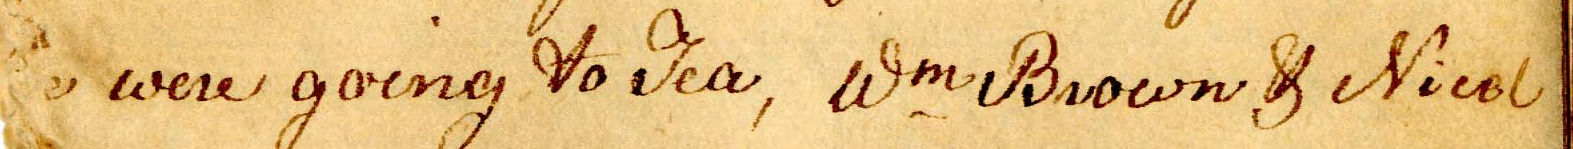e were going to Tea, W^m Brown & Nicol
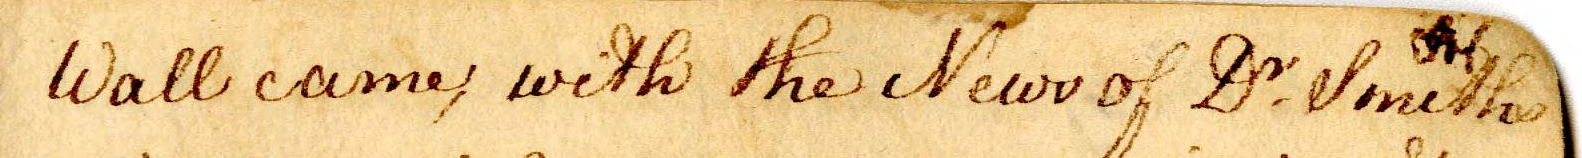Wall came, with the News of D^r. Smiths
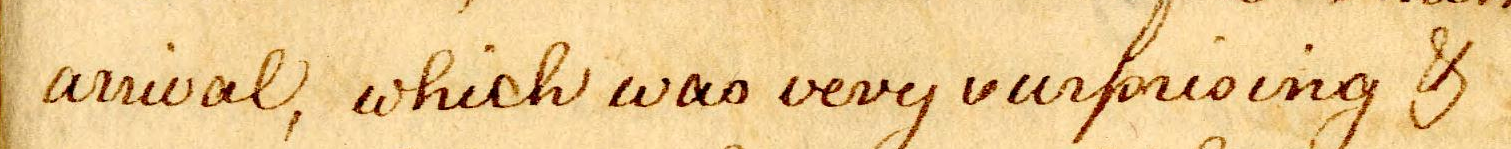arrival, which was very surprising &
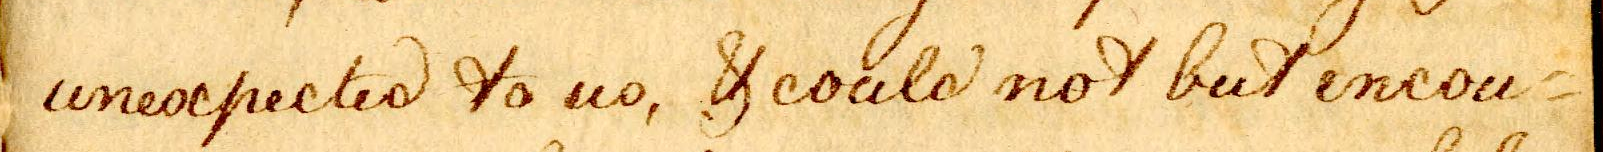unespected to us, & could not but encou-
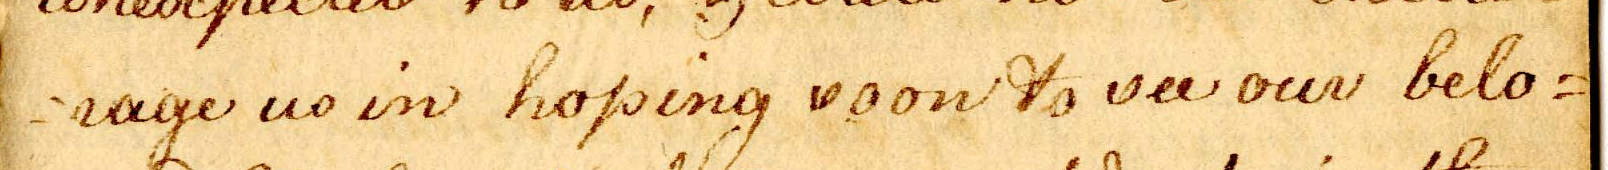-rage us in hoping soon to see our belo-
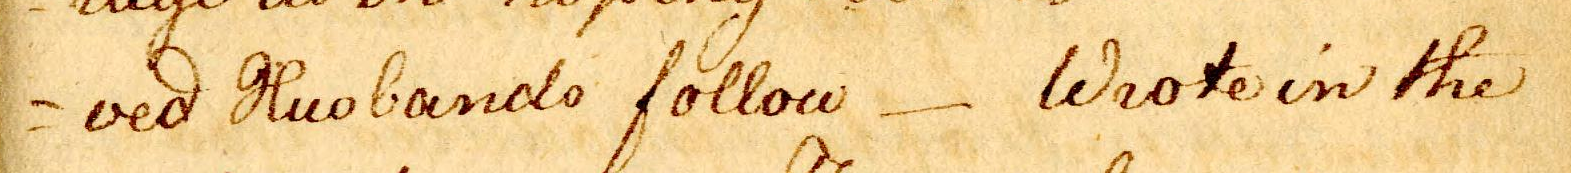-ved Husbands follow- Wrote in the
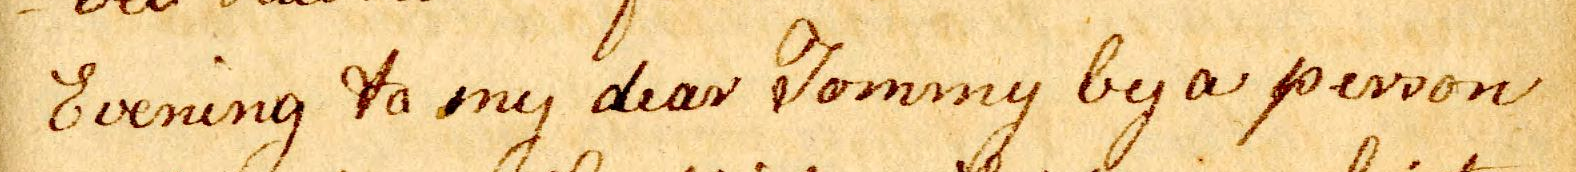Evening to my dear Tommy by a person
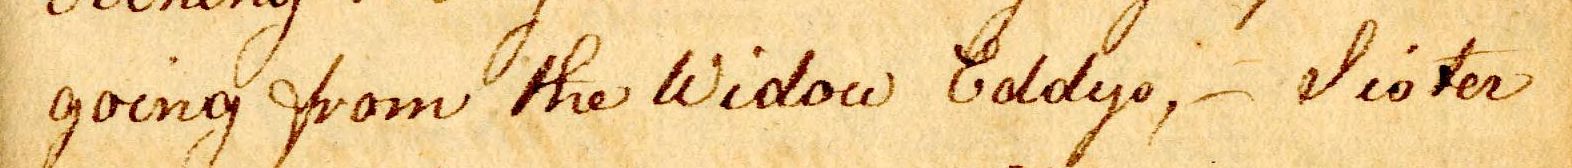going from the Widow Eddys,- Sister
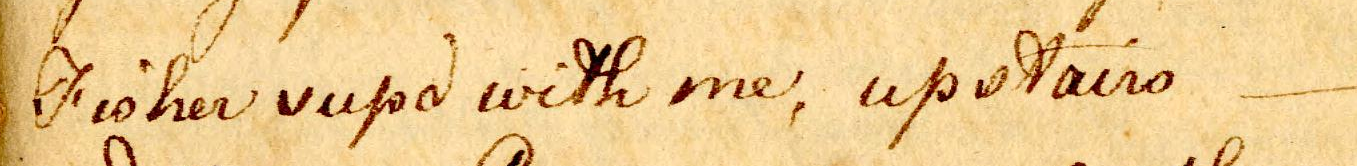Fisher supd with me, upstairs-
